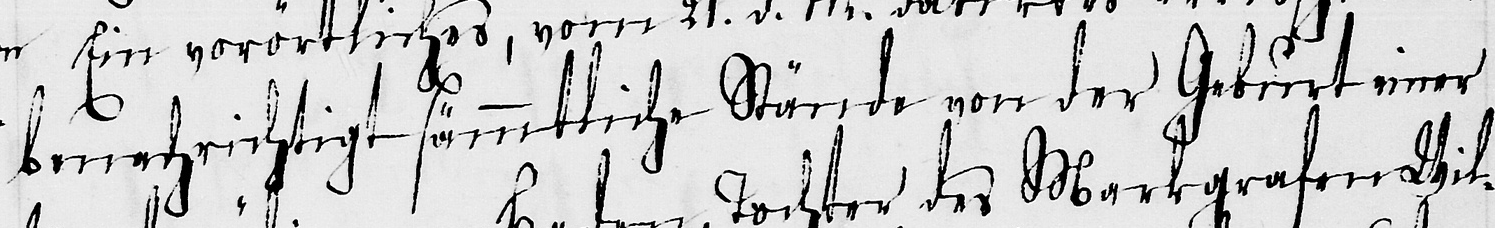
benachrichtigt sämmtliche Stände von der Geburt einer
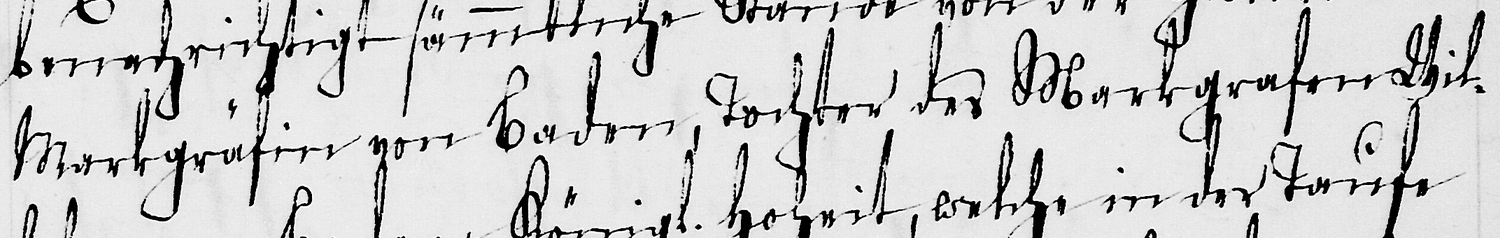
Markgräfin von Baden, Tochter des Markgrafen Wil¬
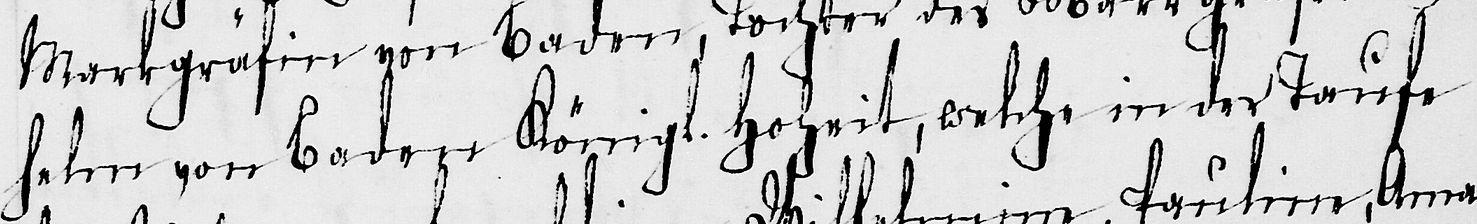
helm von Baden Königl. Hoheit, welche in der Taufe
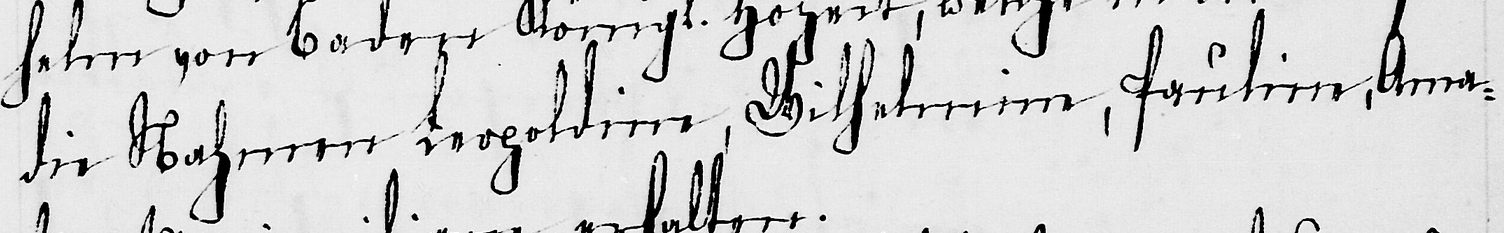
die Nahmen Leopoldine, Wilhelmine, Pauline, Ama¬
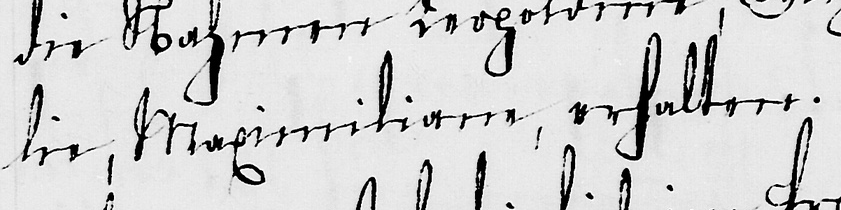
lie, Maximiliane, erhalten.
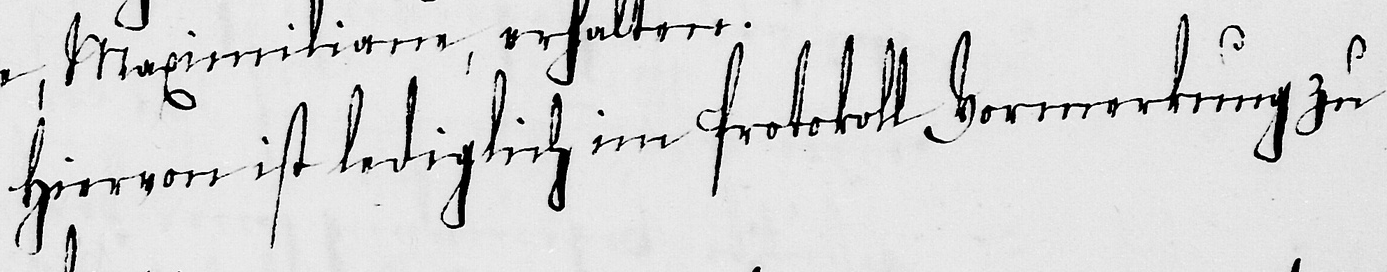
Hiervon ist lediglich im Protokoll Vormerkung zu
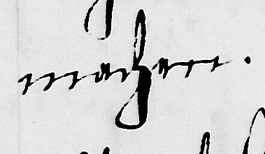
machen.
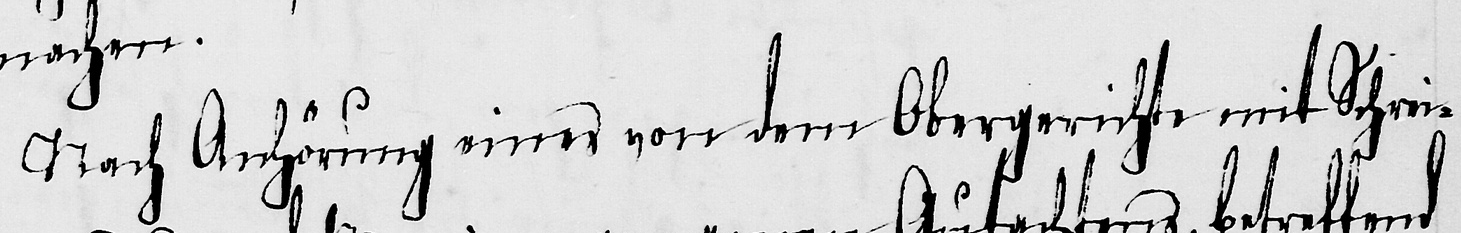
Nach Anhörung eines von dem Obergerichte mit Schrei¬
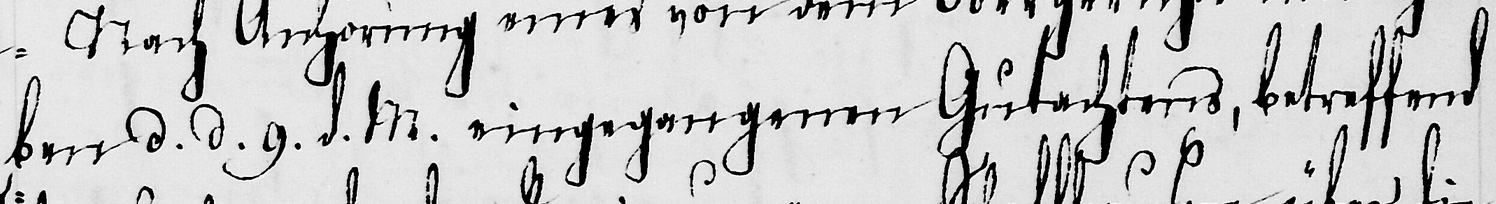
ben d. d. 9. d. M. eingegangenen Gutachtens, betreffend
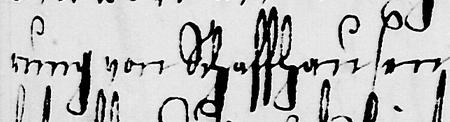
rung von Schaffhausen
